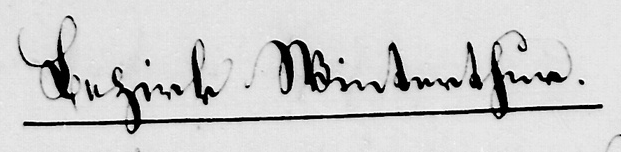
Bezirk Winterthur.
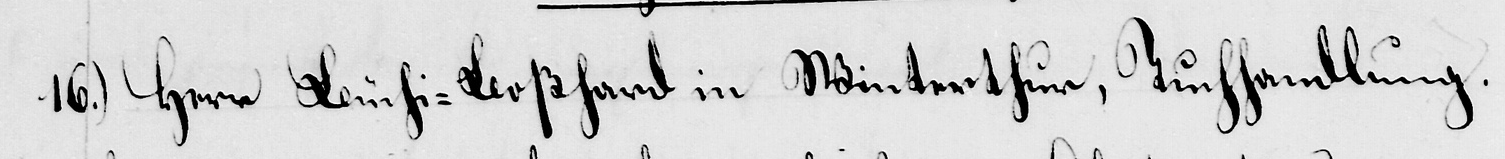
16.) Herr Büchi-Boßhard in Winterthur, Tuchhandlung.
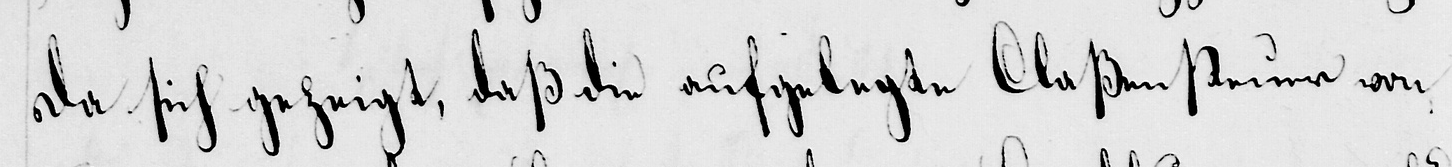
Da sich gezeigt, daß die aufgelegte Claßensteuer von
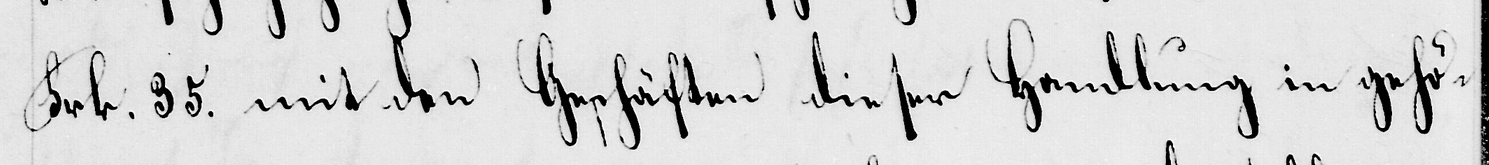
Frk. 35. mit den Geschäften dieser Handlung in gehö¬
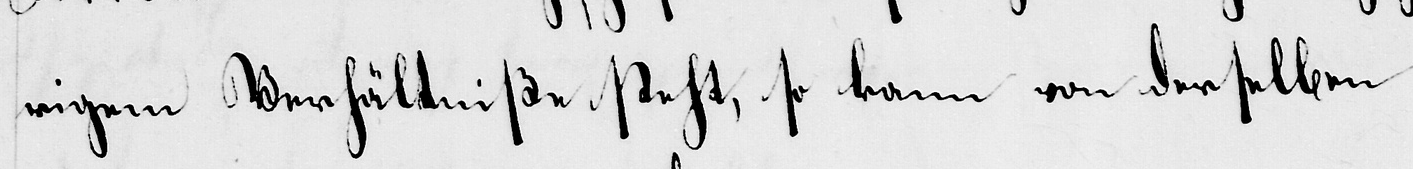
rigem Verhältniße steht, so kann von derselben
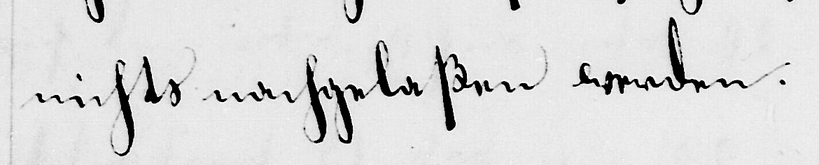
nichts nachgelaßen werden.
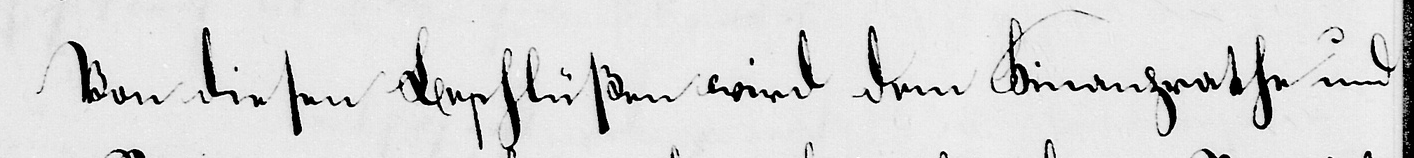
Von diesen Beschlüßen wird dem Finanzrathe und
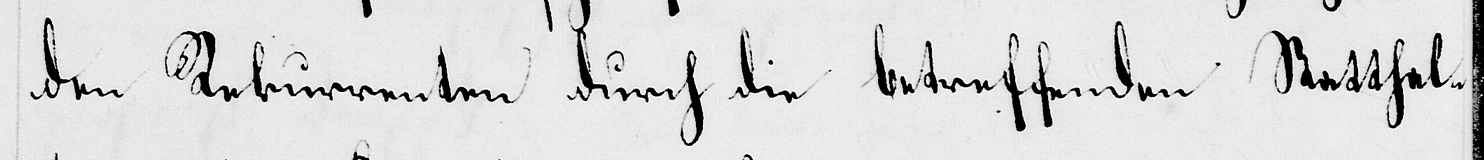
den Rekurrenten durch die betreffenden Statthal¬
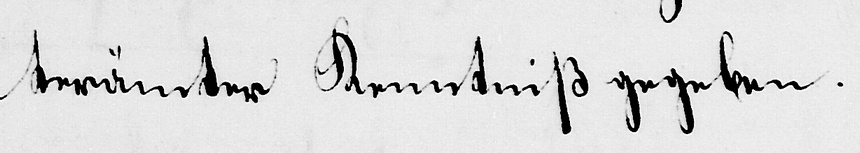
terämter Kenntniß gegeben.
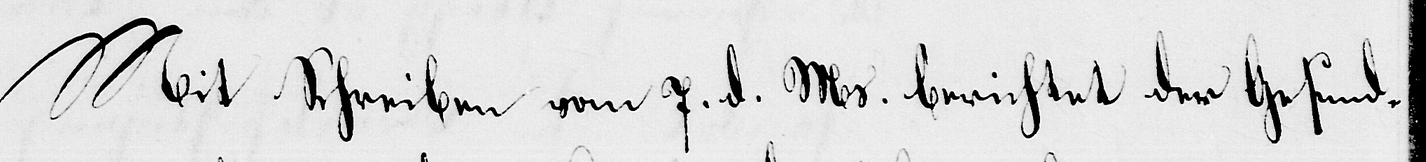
Mit Schreiben vom 7. d. Ms. berichtet der Gesund¬
